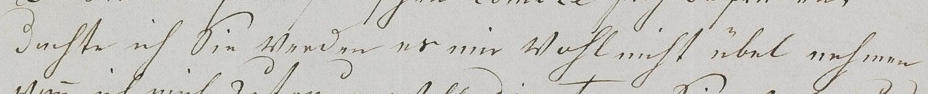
dachte ich Sie werden es mir wohl nicht übel nehmen
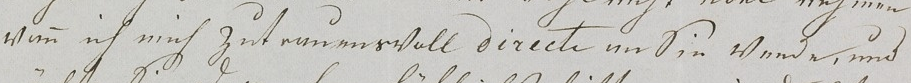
wenn ich mich zutrauensvoll directe an Sie wende, und
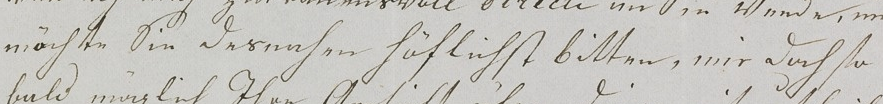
möchte Sie desnahen höflichst bitten, mir doch so
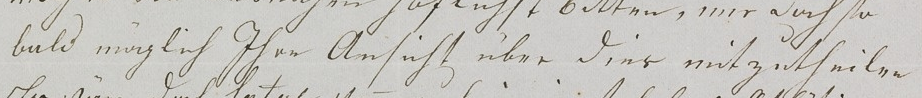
bald möglich Ihre Ansicht über dies mitzutheilen.
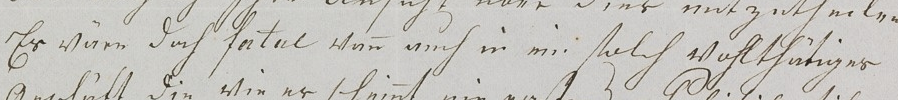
Es wäre doch fatal wenn auch in ein solch wohlthätiges
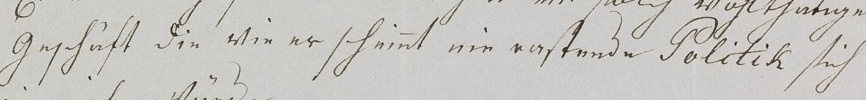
Geschäft die wie es scheinnt nie rastende Politik sich
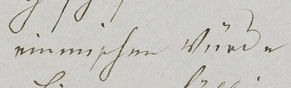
einmischen würde.
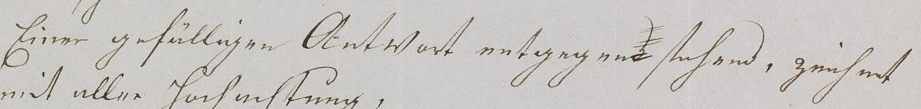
Einer gefälligen Antwort entgegend sehend, zeichnet
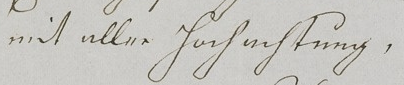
mit aller Hochachtung,
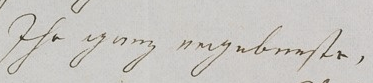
Ihr ganz ergebenster,
